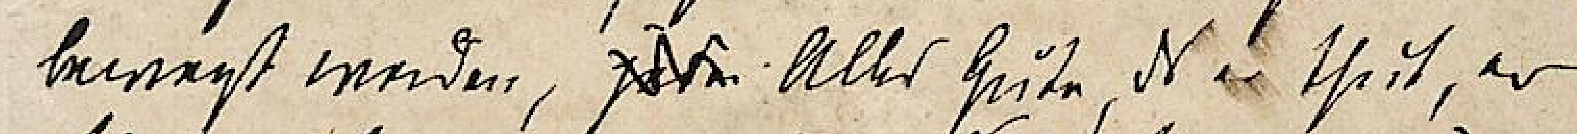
bewegt werden, jede Alles Gute, ds er thut, er
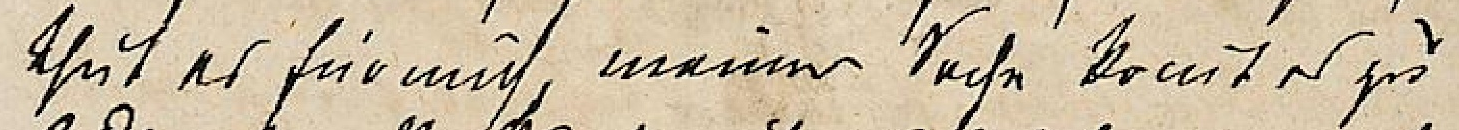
thut es für mich, meiner Sache komt es zu
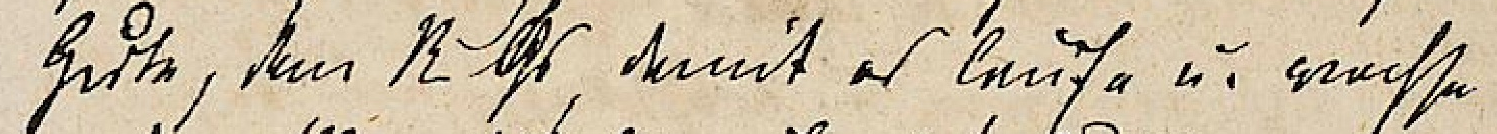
Gute, dem R. Gs, damit es laufe u. wachse
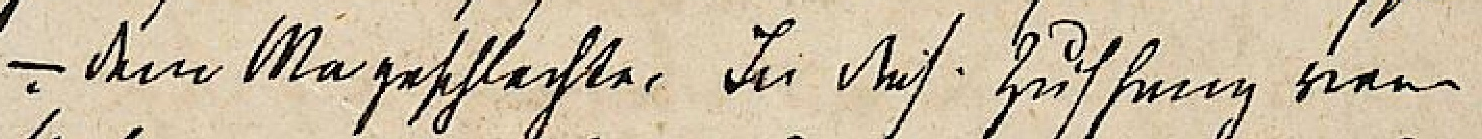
_ dem Mngeschlechte. In dies. Zushang ver¬
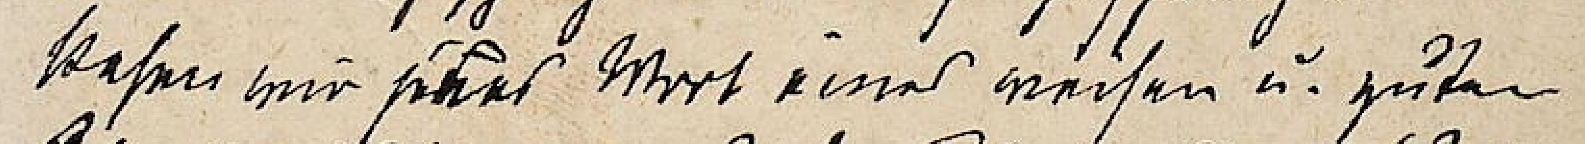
stehen wir jenes Wort eines weisen u. guten
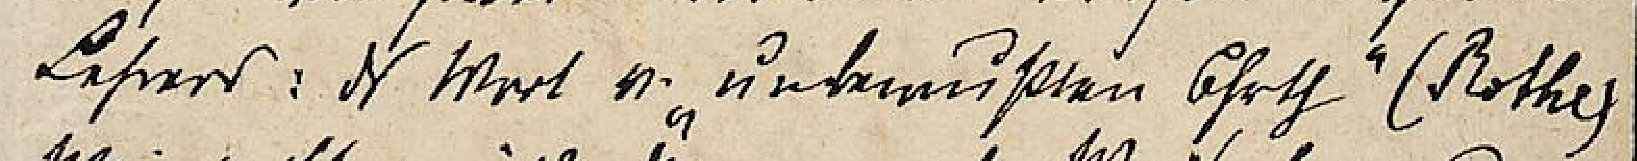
Lehrer: ds Wort v. unbewußtem Chrth" (Rothe)
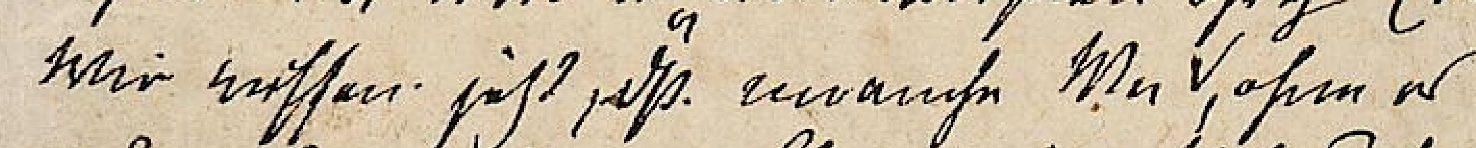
Wir wissen jetzt, daß manche Mn, ohne es
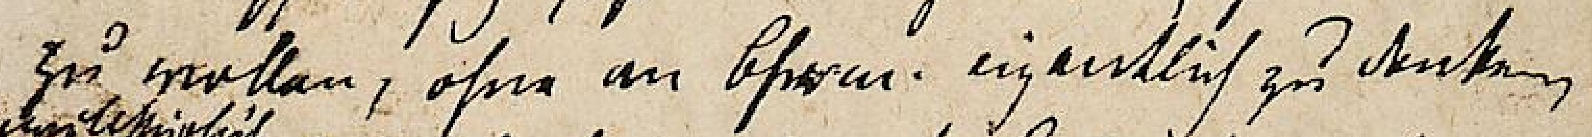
zu wollen, ohne an Chrm eigentlich zu denken
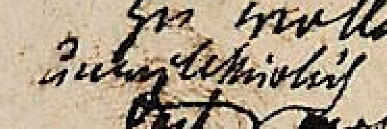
unwillkürlich
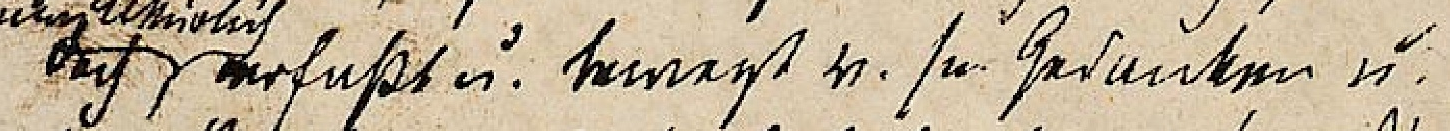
doch erfaßt u bewegt v. sn Gedanken u
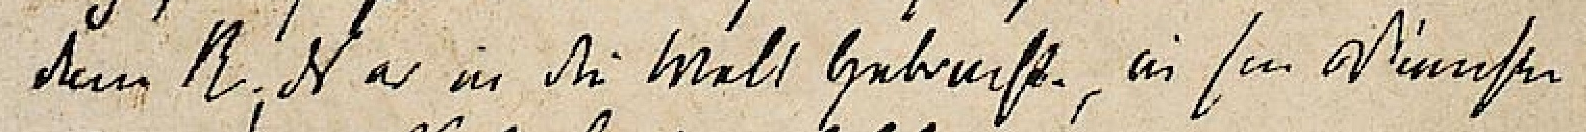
dem R. ds er in die Welt gebracht, in sm Dienste
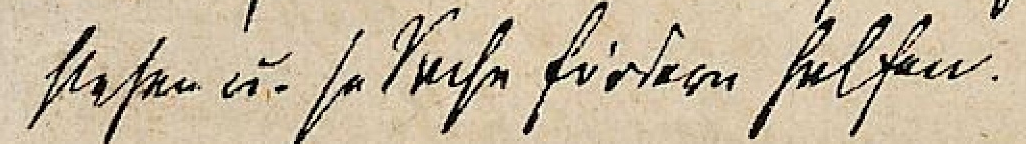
stehen un sn Sache fördern helfen.
